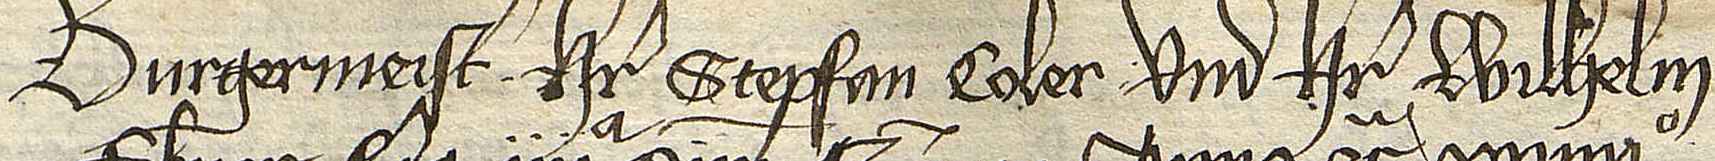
Burgermeiſt* Hr* Stepfan Coler Vnd Hr* Wilhelm
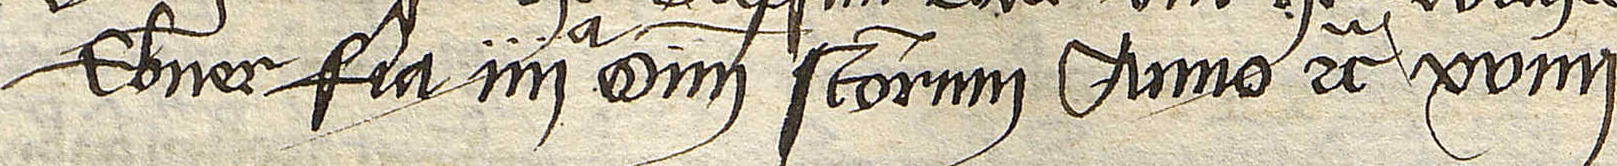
Ebner fi*a iiii* Omi* ſcorum* Anno ec* xviiii*
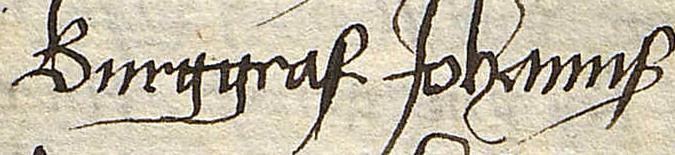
Burggraf Iohannſ*
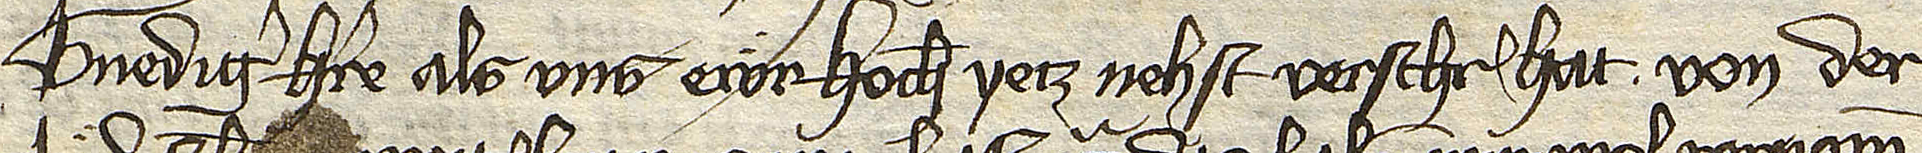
Gnedig* h*re als vns eẅr Hoch* yecʒ nehſt verſchr* hat . von der
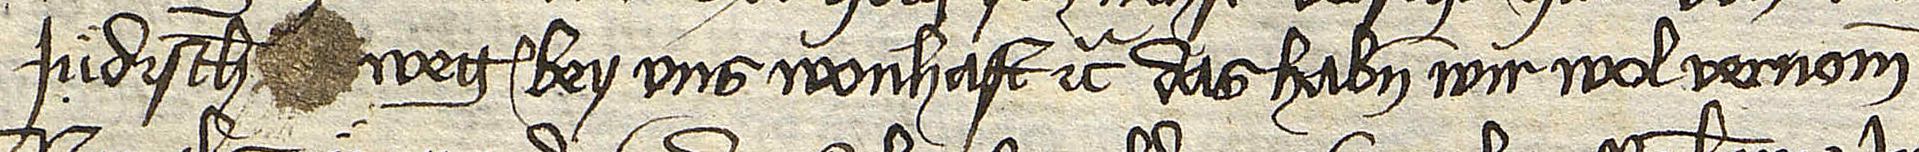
Iüdiſch* weg* bey vns wonhaft ec* das habn* wir wol vernom*
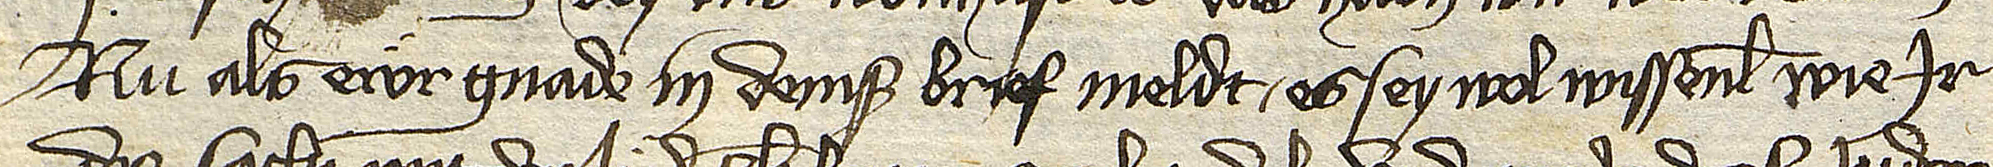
Nu als eẅr gnade in demſ* brief meldt / es ſey wol wiſſenl* wie Ir
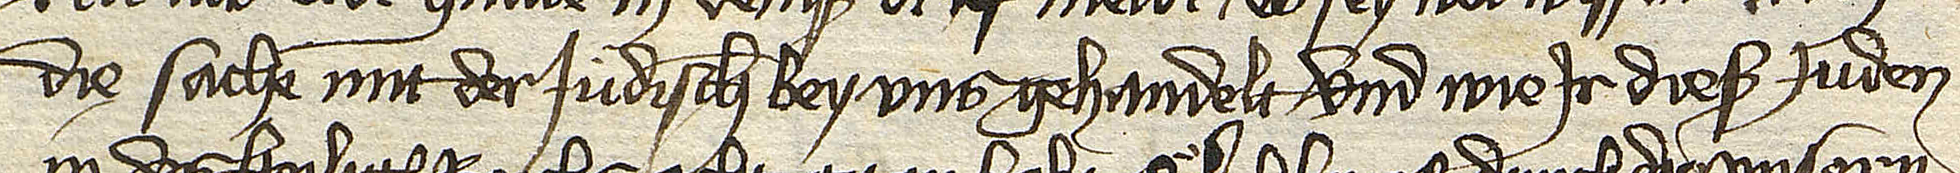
die ſache mit der Iüdiſch* bey vns gehandelt / Vnd wie Ir dieſ* Iuden
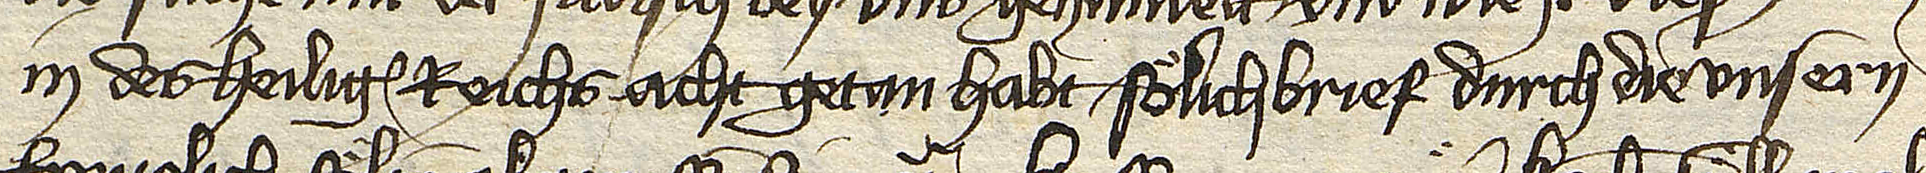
in des heilig* Reichs acht getan habt / ſölich brief durch die vnſern
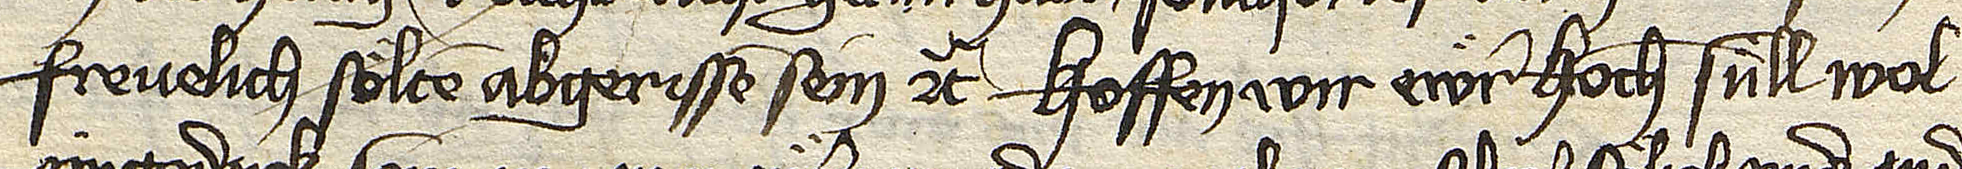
freuelich ſölte* abgeriſſe* ſein ec* Hoffen wir eẅr* hoch* ſüll wol
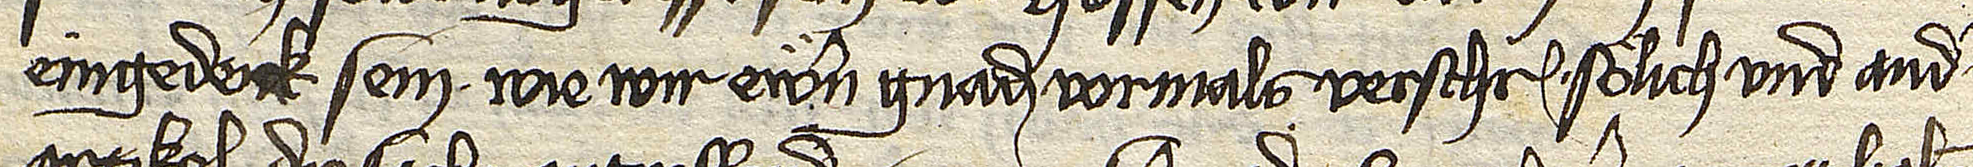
eingedenk ſein . wie wir eẅ*n gnad* vormals verſchr* . ſölich vnd and*
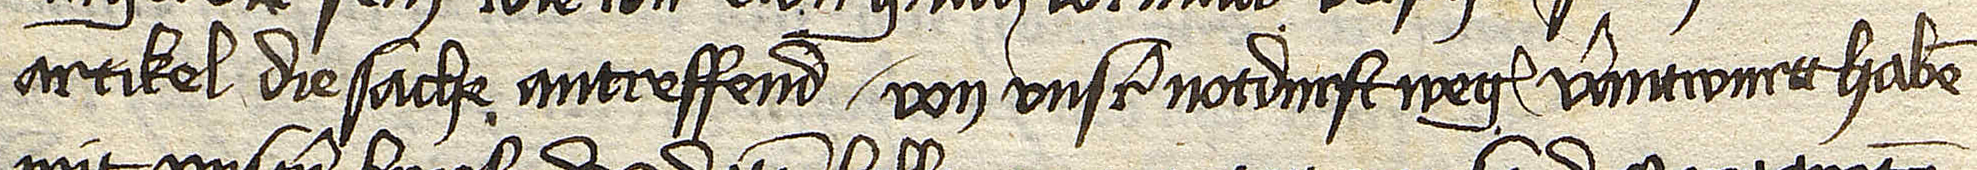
artikel die ſache antreffend / von vnſr* notdurft weg* v*antwurtt habe*
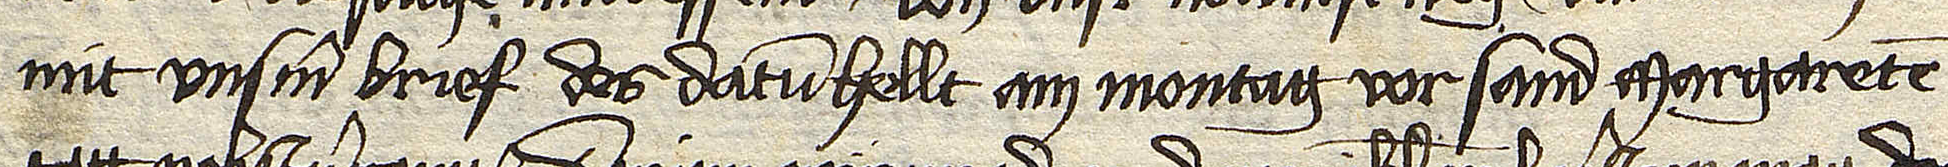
mit vnſm* brief des datu* hellt am montag vor ſand Margarete*
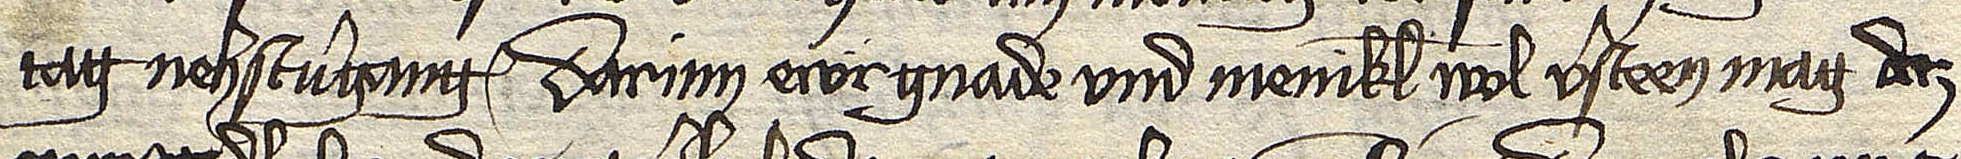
tag nehſtu*gang* Darinn eẅr gnade vnd menikl* wol v*ſteen mag daʒ
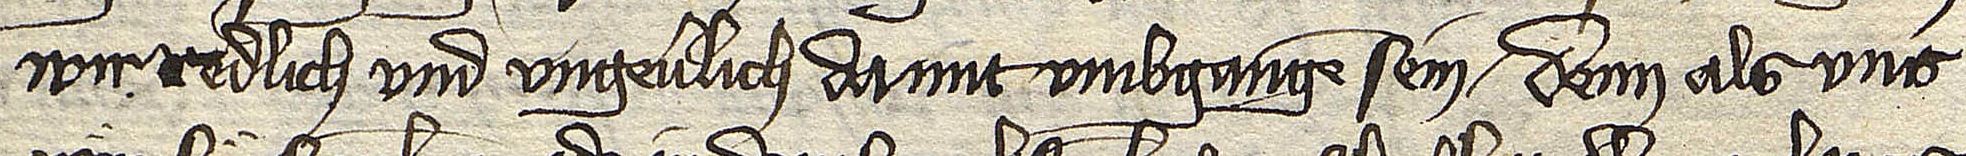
wir redlich vnd vngeu*lich damit vmbgange* ſein / Denn als vns
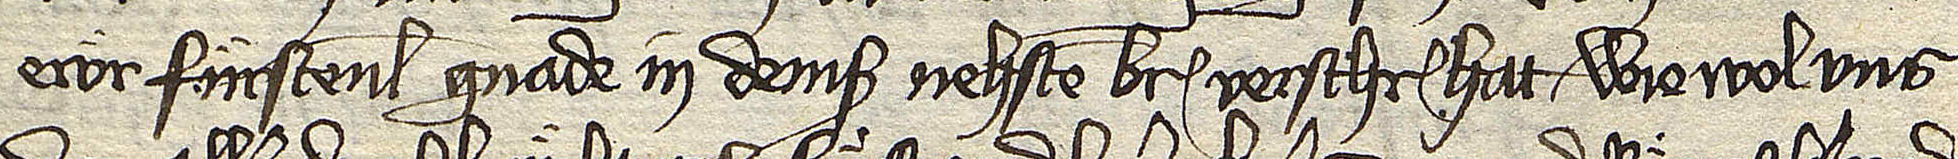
eẅr fürſtenl* gnade in demſ* nehſte* br* verſchr* hat / wie wol vns
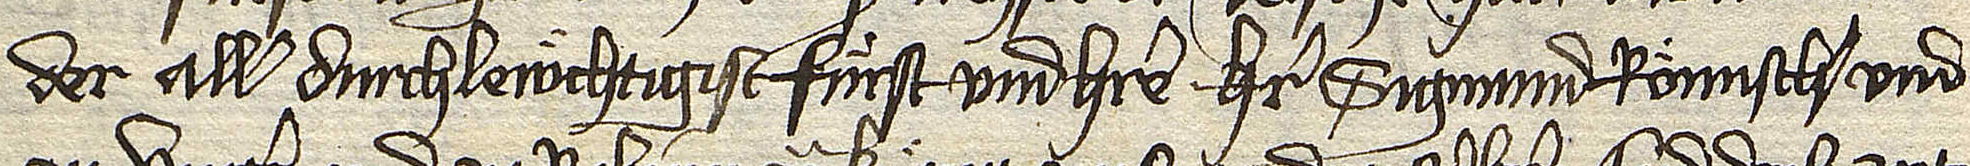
der all* durchleẅchtigiſt fürſt vnd h*re hr* Sigmund Römiſch* vnd
